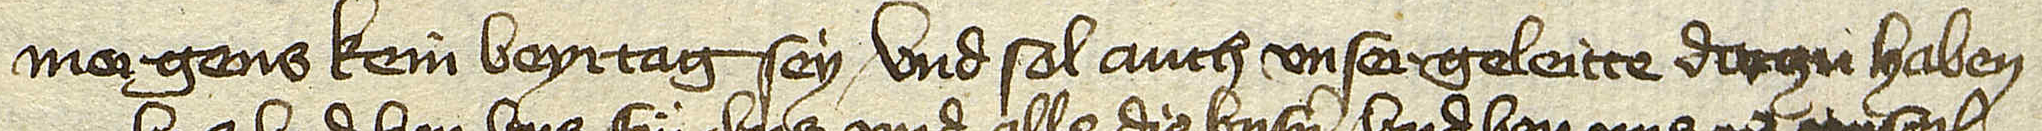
morgens kein beytrag ſey / vnd ſol auch vnſer geleitte darcʒu haben
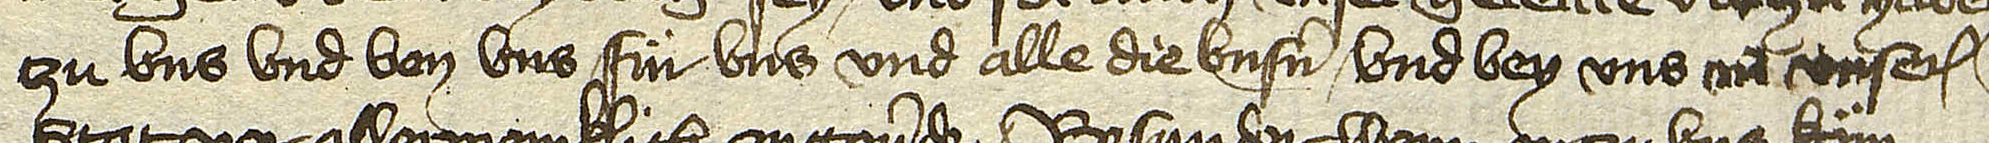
cʒu vns vnd von vns für vns vnd alle die vnſn* / vnd bey vns in vnſer*
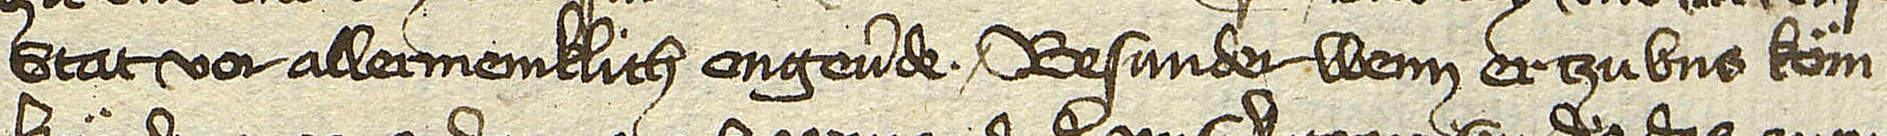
Stat vor allermeniklich ongeu*de . / Beſunder wenn er cʒu vns köm
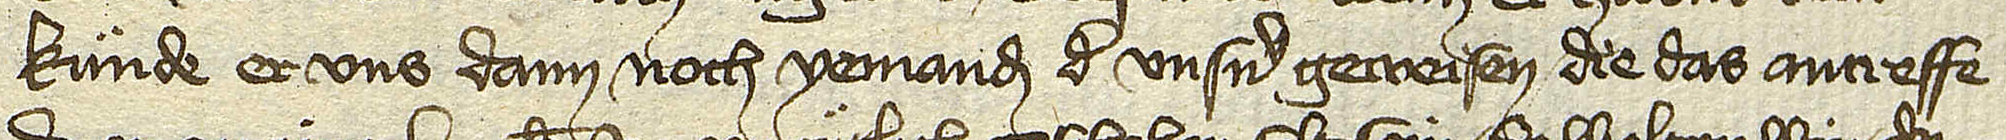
künde er vns dann noch yemand* d* vnſn* geweiſen die das antreffe
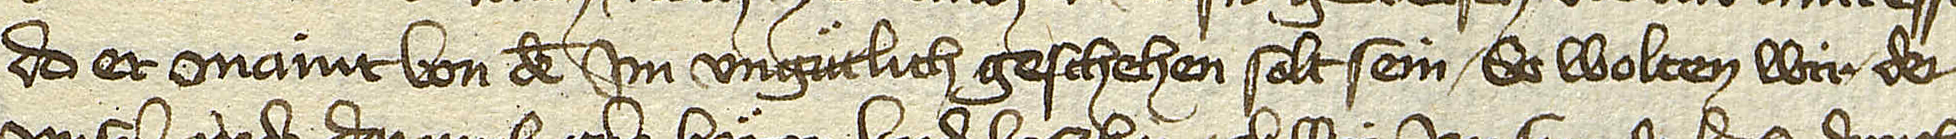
do er maint von de* Im vngütlich geſchehen ſolt ſein / So wolten wir der
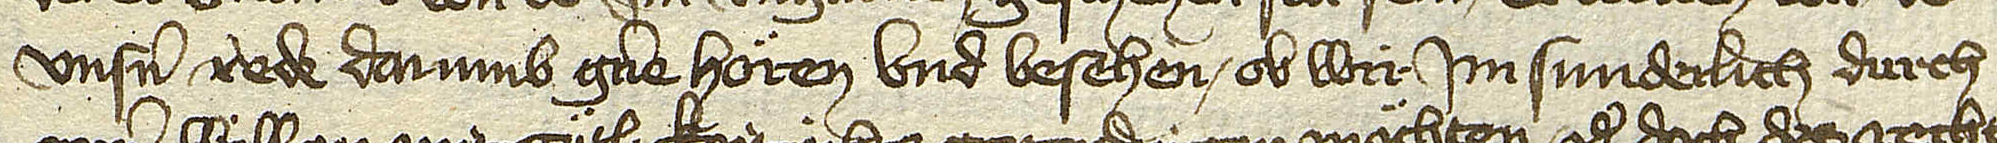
vnſn* rede darumb g*ne hören vnd beſehen / ob wir Im ſunderlich durch
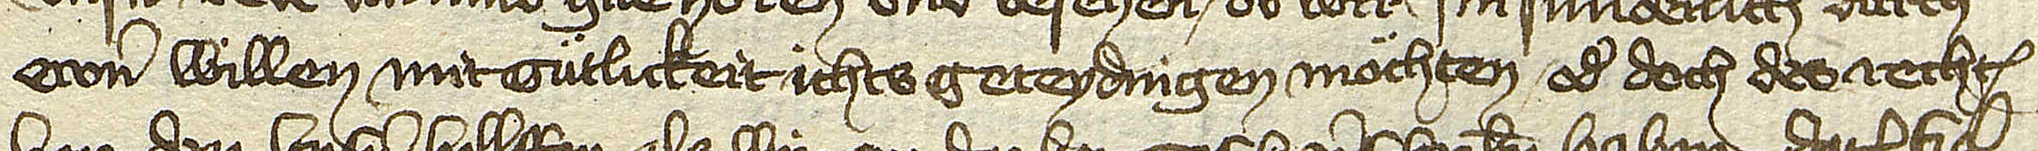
ewn* willen mit gütlichkeit ichts geteydingen möchten od* doch des recht*
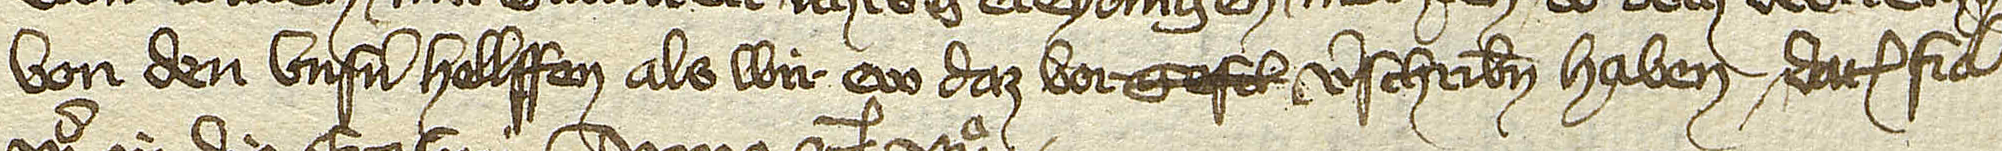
von den vnſn* helffen als wir ew daʒ vor geſc v*ſchribn* haben / dat* fia*
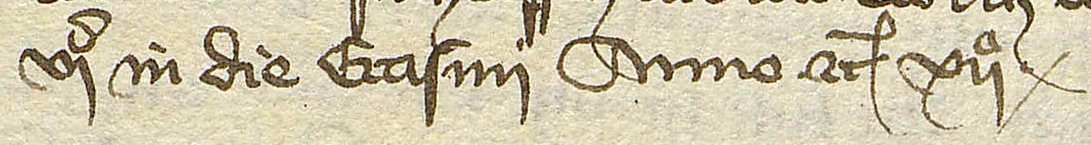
vi* in die Eraſim Anno ec* xii* . /
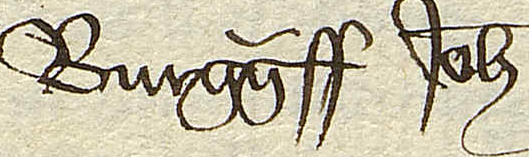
Burgg*ff Ioh*
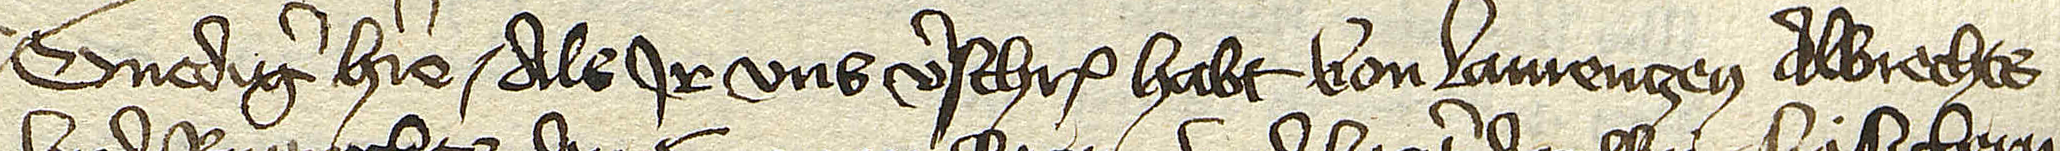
Gnedig* h*re / Als Ir vns v*ſchr* habt von Laurencʒen Albrechts
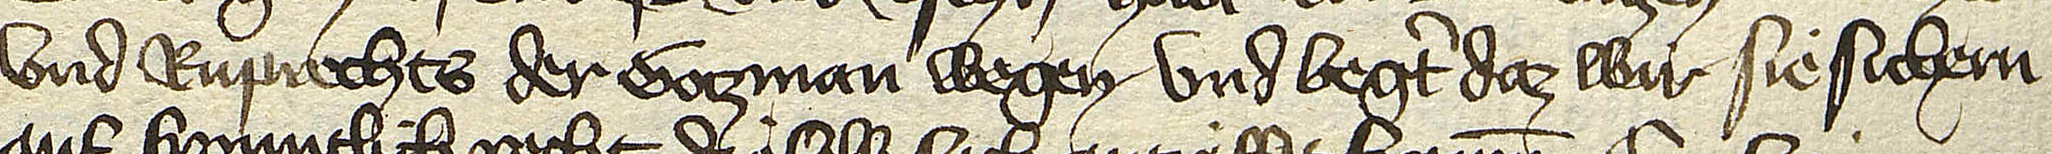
vnd Ruprechs der Gocʒman wegen / vnd beg*t daʒ wir ſie ſichern
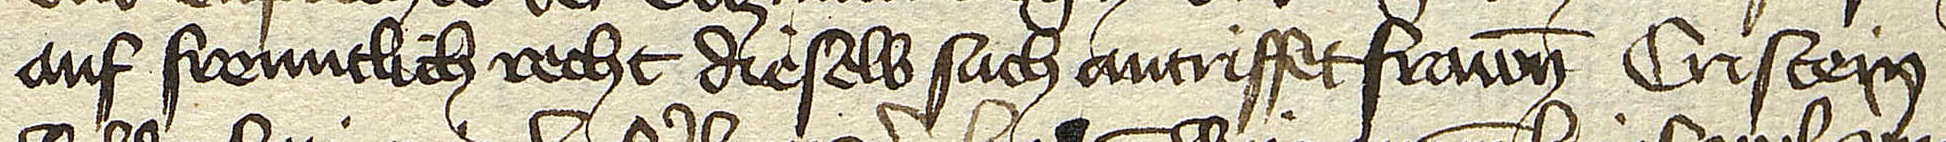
auf freuntlich recht dieſelb ſach antriffet frawn* Criſtein
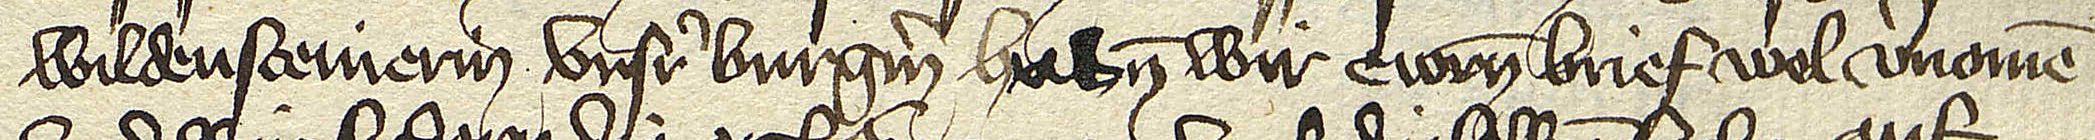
wildenſteinerin vnſr* burg*in habn* wir ewrn* brief wol vnome*
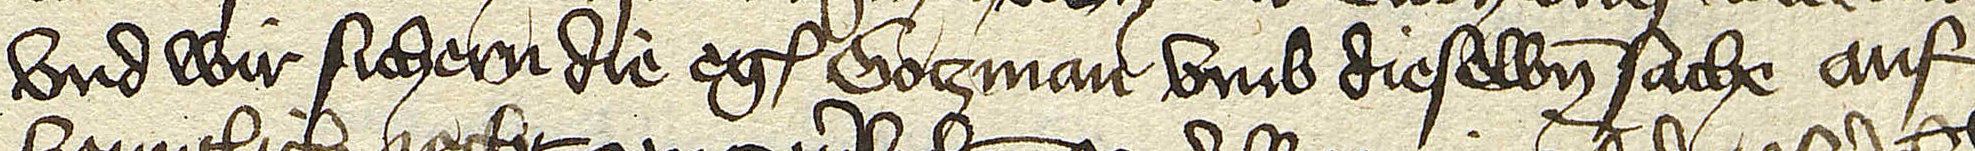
vnd wir ſichern die eg* Gocʒman vmb dieſelbn* ſache auf
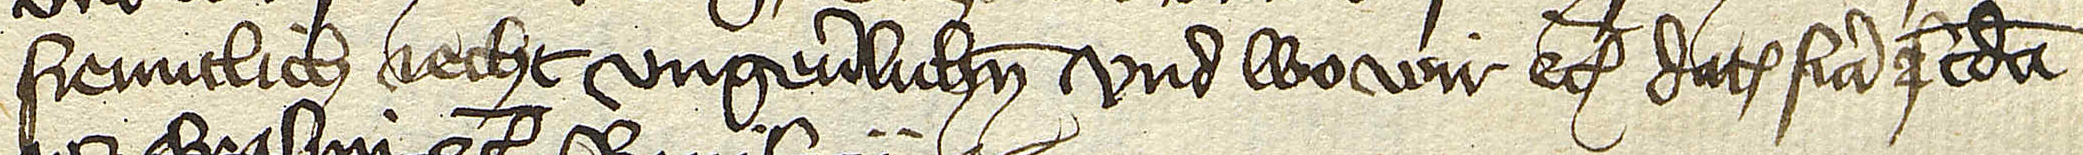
freuntlich recht vngeu*lichn* vnd wo wir ec* dat* fia* ſcda*
